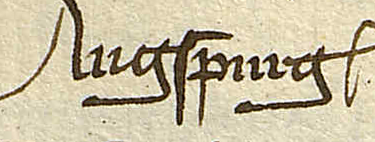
Augſpurg*
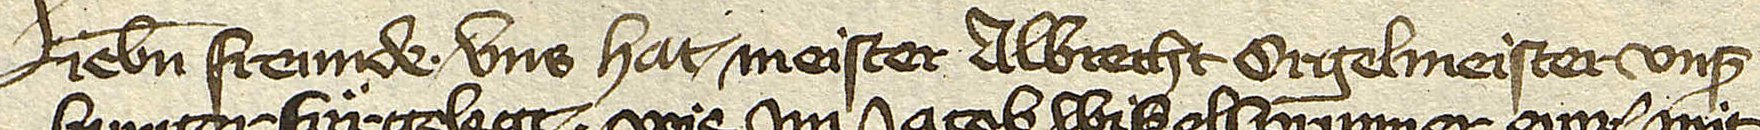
Liebn* freunde . / Vns hat / meiſter Albrecht Orgelmeiſter vnſ*
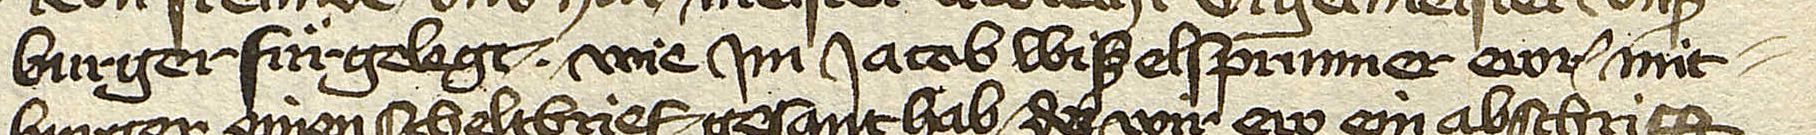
burger fürgelegt / . wie Im Iacob wiſʒelſprunner ewr* mit =
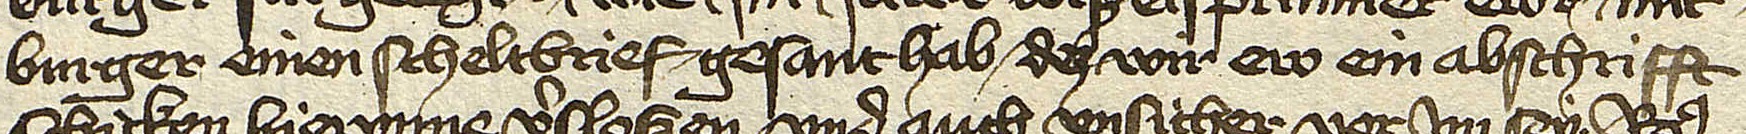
burger einen ſcheltbrief geſant hab / deʒ wir ew ein abſchrifft
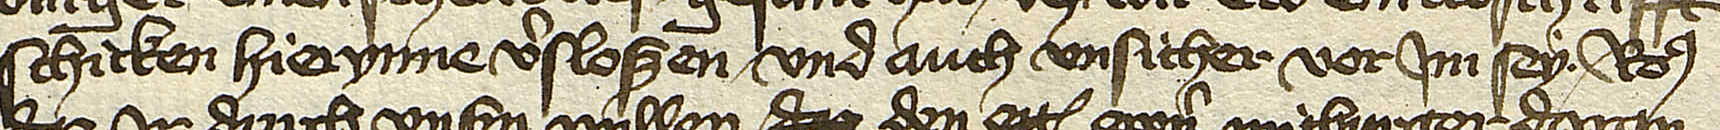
ſchicken hierynne v*ſloſʒen / vnd auch vnſicher vor Im ſey . / Ro*
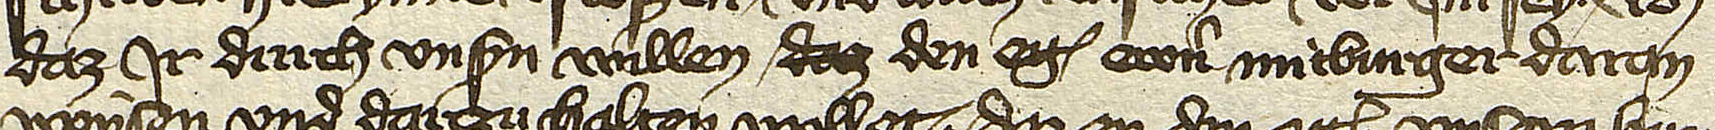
daʒ Ir durch vnſ*n willen / daʒ den eg* ewn* mitburger daran
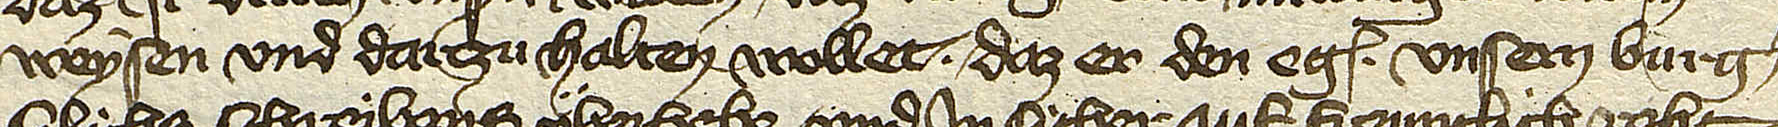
weyſen vnd dawrcʒu halten wollet / . daʒ er den eg* . vnſern burg*
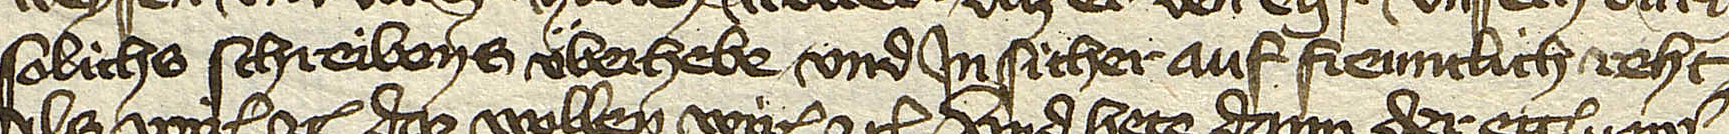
ſolichs ſchreibens v̈berhebe / vnd In ſicher auf freuntlich reht
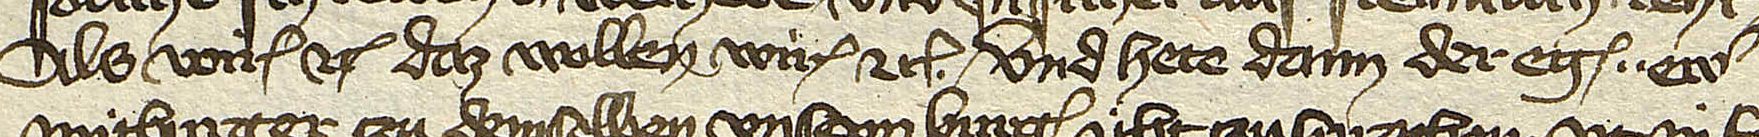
Als wir ec* daʒ wollen wir ec* / vnd hete dann der eg* ~ ew*
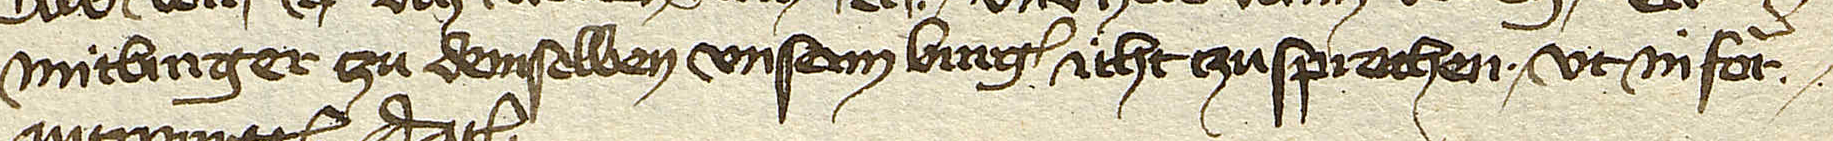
mitburger cʒu demſelben vnſerm burg* icht cʒuſprechn . / vt in for* . /
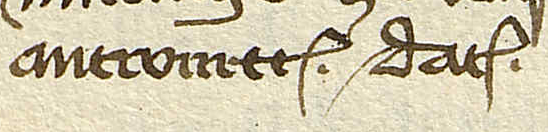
antwurtt* . / dat* .
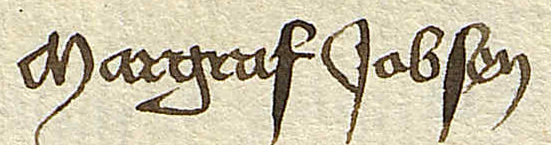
Margraf Iobſen
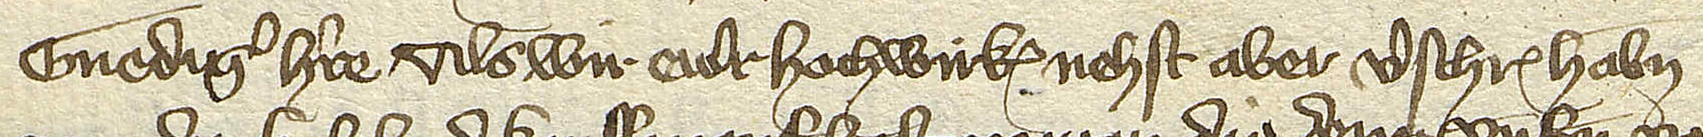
Gnedig* h*re / Als wir ew*r hochwirk* nehſt aber v*ſchr* habn*
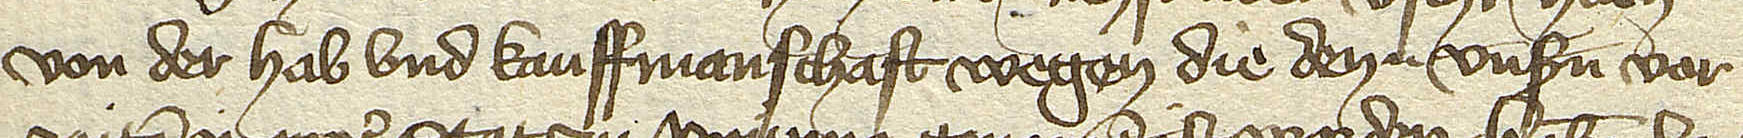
von der hab vnd kauffmanſchaft wegen die den ~ vnſ*n vor
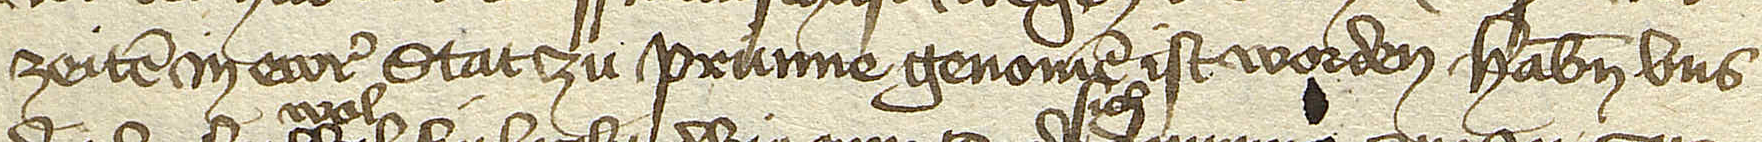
cʒeite* in ewr* Stat cʒu Prünne genome* iſt worden / habn* vns
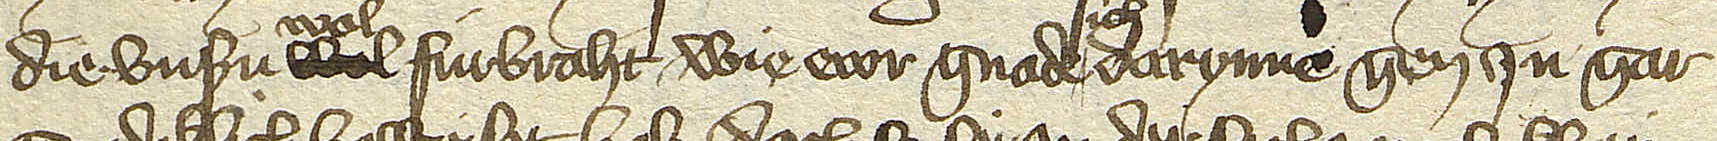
die vnſ*n wol fürbraht / wie ewr gnade darynne gen In gar
